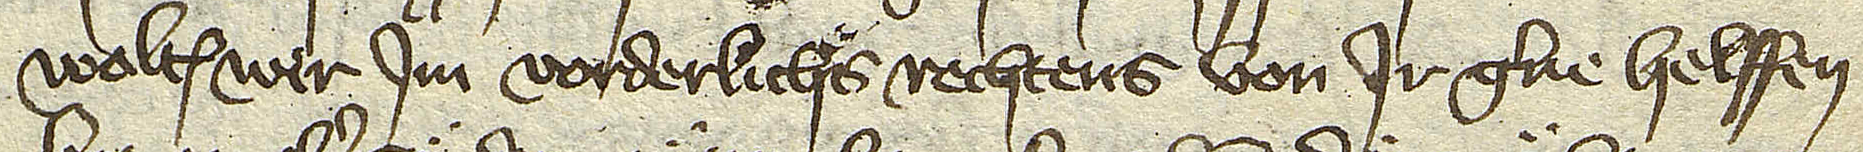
wolt* wir Im vorderlichs rechtens von Ir g*ne helffen
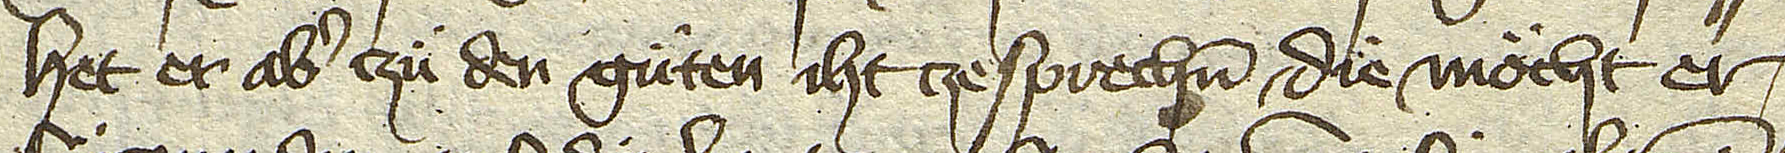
het er ab* cʒü den güten iht cʒeſprechn* / die möcht er
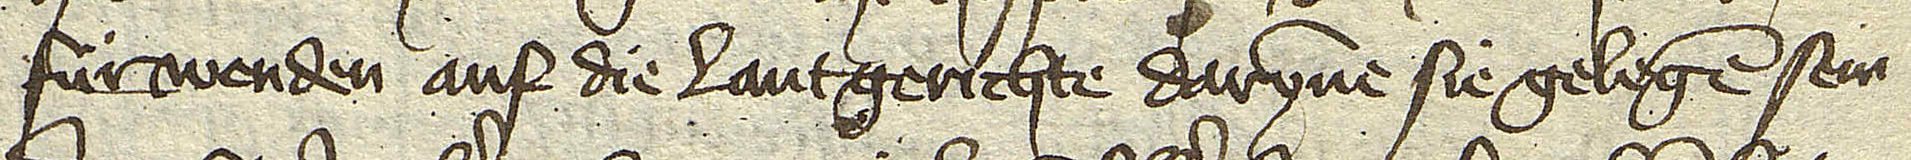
für wenden auf die Lantgerichte daryne* ſie gelege* ſein
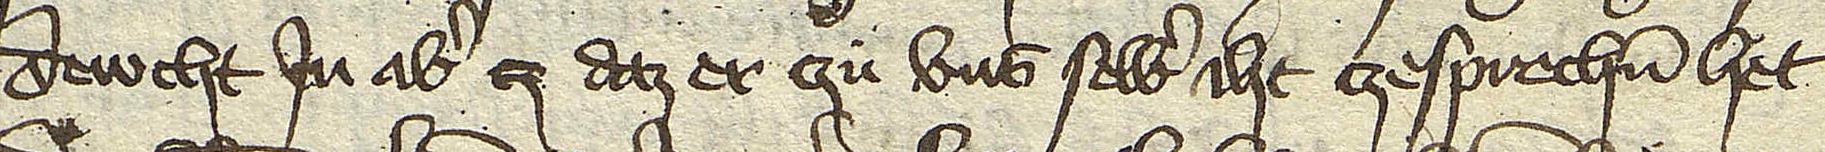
Dewcht In ab* cʒ daʒ er cʒü vns ſelb* iht cʒeſprechn* het
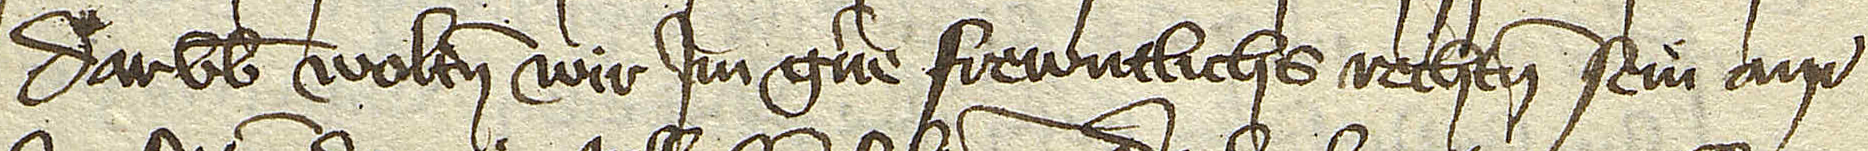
Darv*b woltn* wir Im g*ne frewntlichs rechtn* ſein an
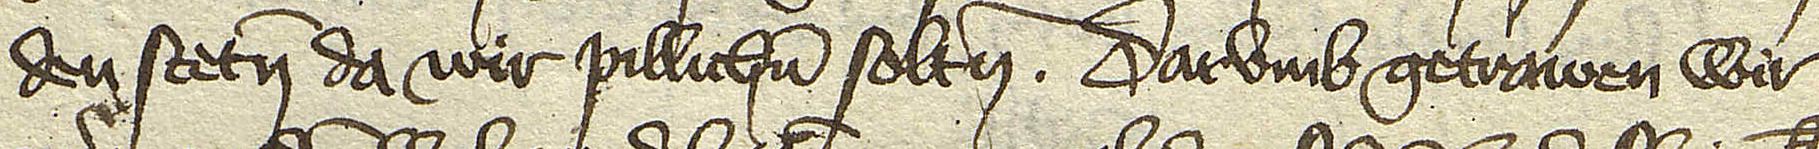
den ſtetn* da wir pillichn* ſoltn* . Darvmb getrawen wir
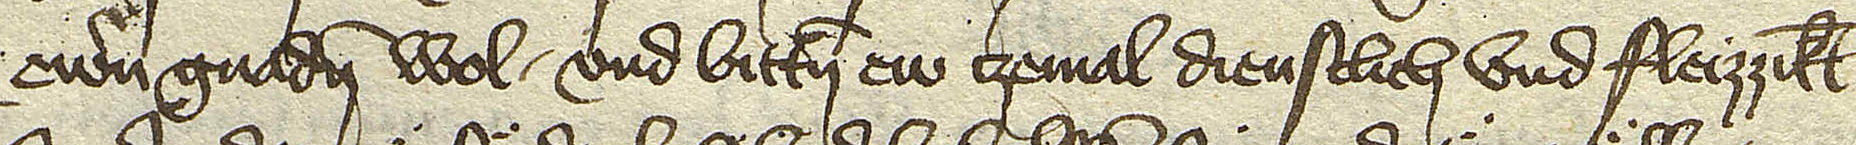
ew*n gnadn* wol / vnd bittn* ew cʒemal dienſtlich vnd fleiʒʒikl*
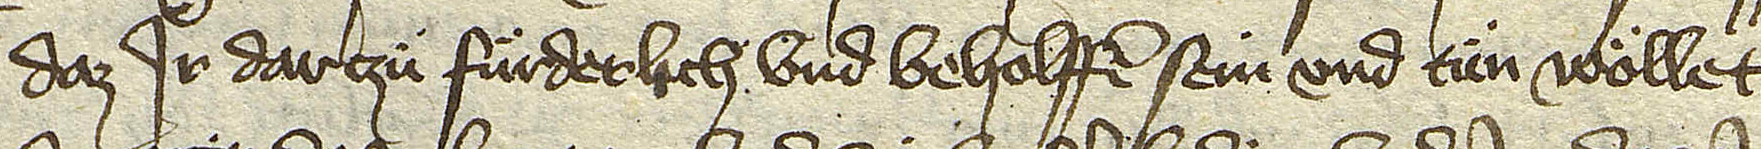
daʒ Ir darcʒü fürderlich vnd beholffe* ſein vnd tün wöllet
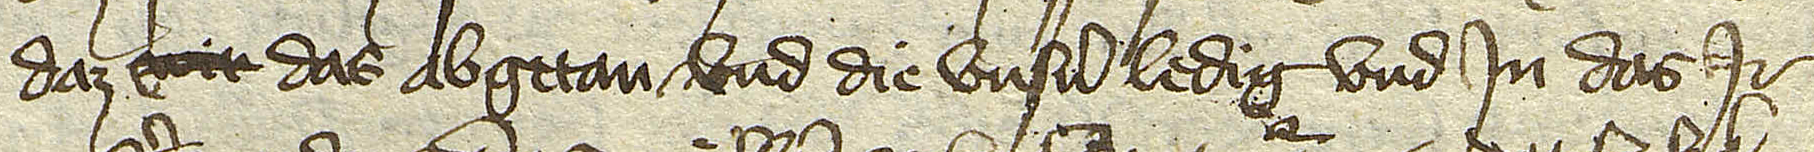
daʒ wir das abgetan / vnd die vnſn* ledig vnd In das Ir
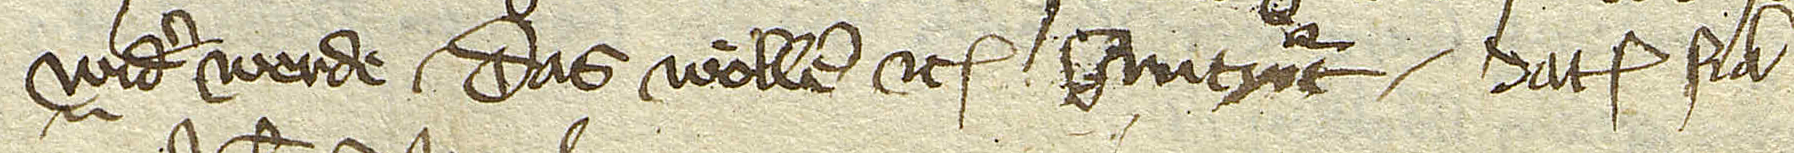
wid* werde / Das wölle* ec* Antwt* / dat* fia*
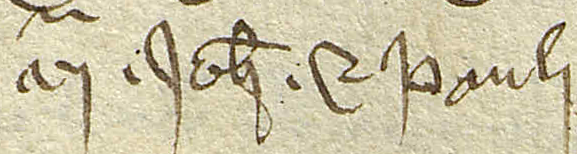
vi* . Ioh* . @ Pauli
